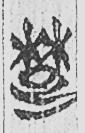楚
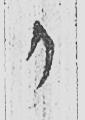人
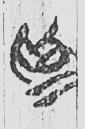爲
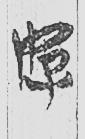好
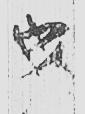𡚦
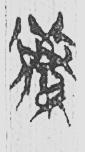{敓糸}
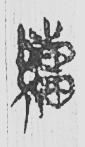{糸東田}
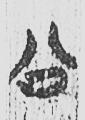公
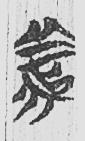義
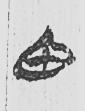囟
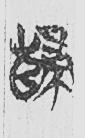{𡴎帚}
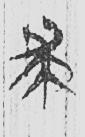求
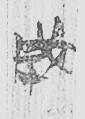成
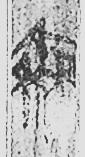秦
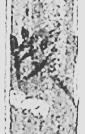𡚦
